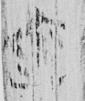囦（淵）
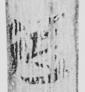○（起）
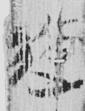逾
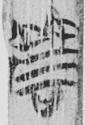○（席）
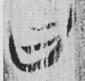曰
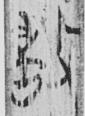敢
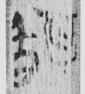䎽（問）
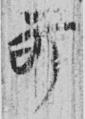可（何）
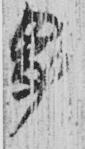{胃刀}（謂）
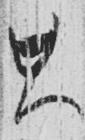也
